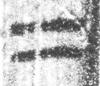二
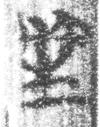笙
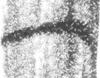一
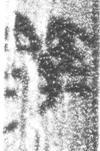竽
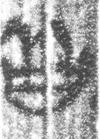皆
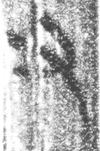又（有）
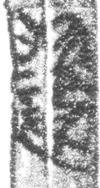○（韜）
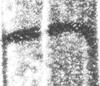一
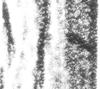一
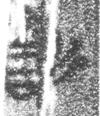彫（雕）
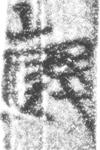鼓
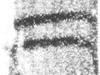二
